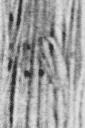之
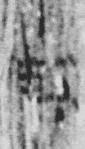紿（治）
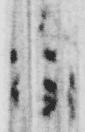谷（欲）
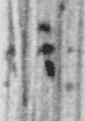亓（其）
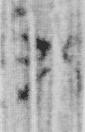折
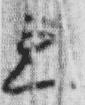也
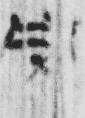凡
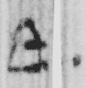身
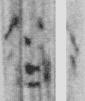谷（欲）
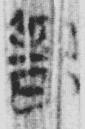○（静）
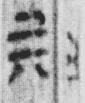而
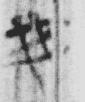母
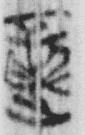遣（谴）
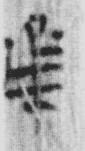甬（用）
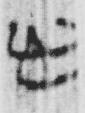心
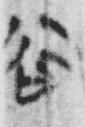谷（欲）
